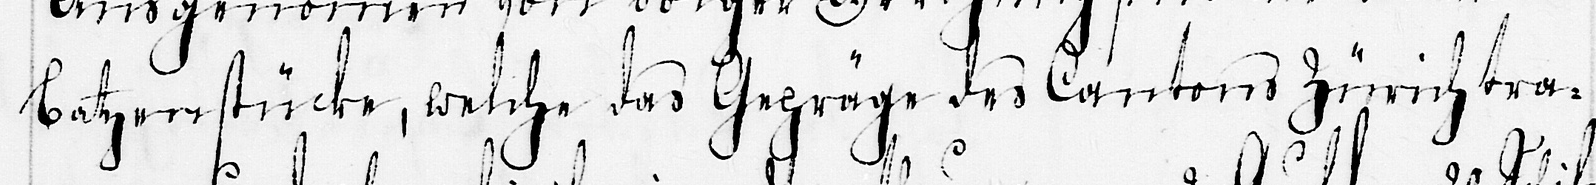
Batzenstücke, welche das Gepräge des Cantons Zürich tra¬
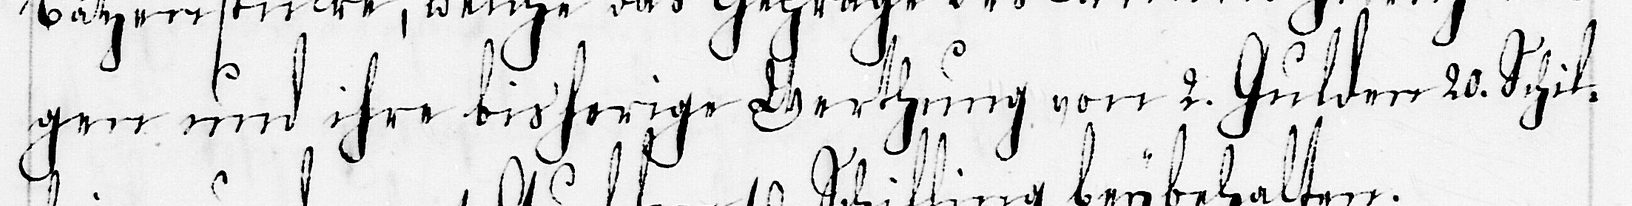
gen und ihre bisherige Werthung von 2. Gulden 20. Schil¬
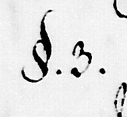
§. 3.
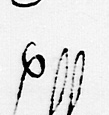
18. “ “
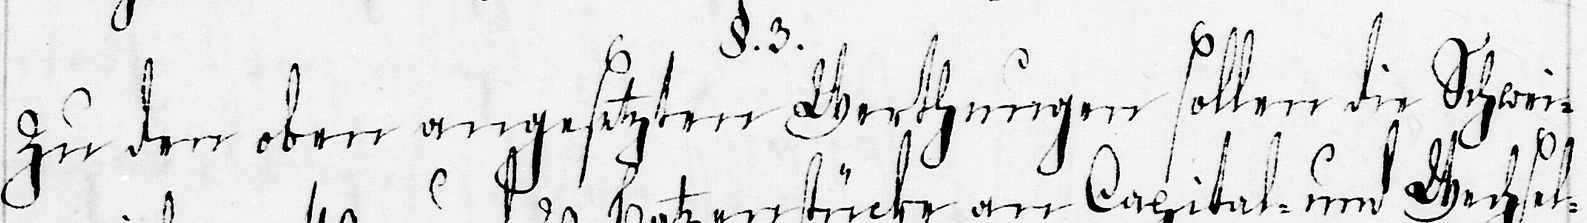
Zu den oben angesetzten Werthungen sollen die Schwei¬
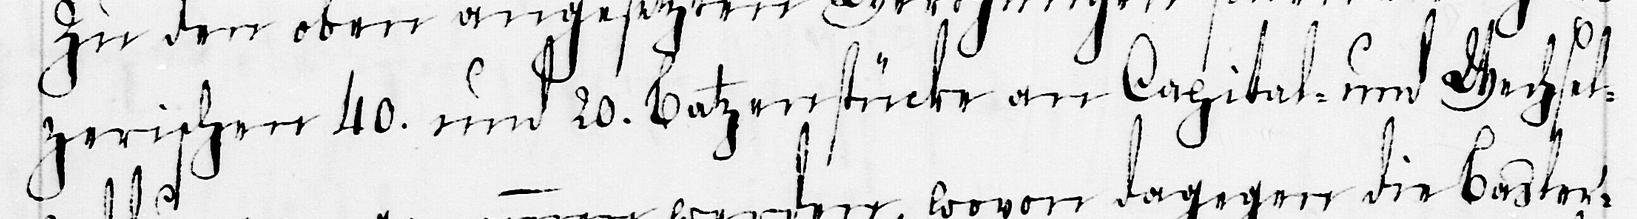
zerischen 40. und 20. Batzenstücke an Capital- und Wechsel¬
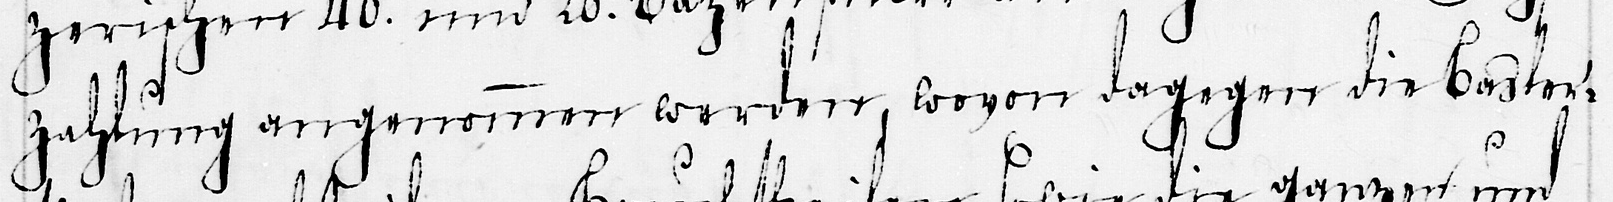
zahlung angenommen werden, wovon dagegen die Basler¬
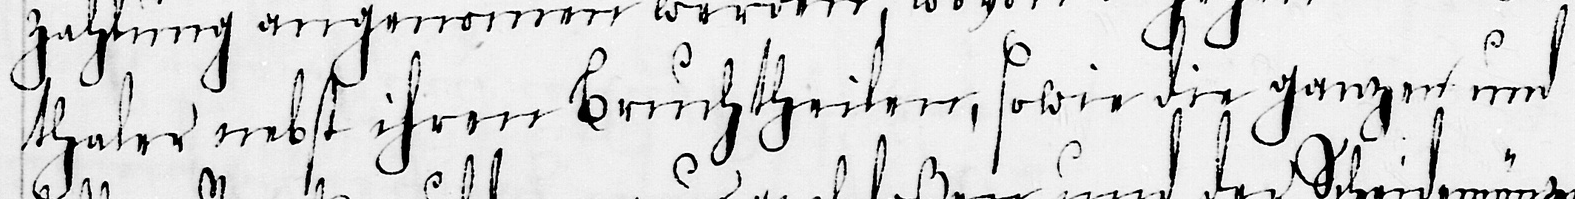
thaler nebst ihren Bruchtheilen, sowie die ganzen und
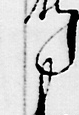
2.
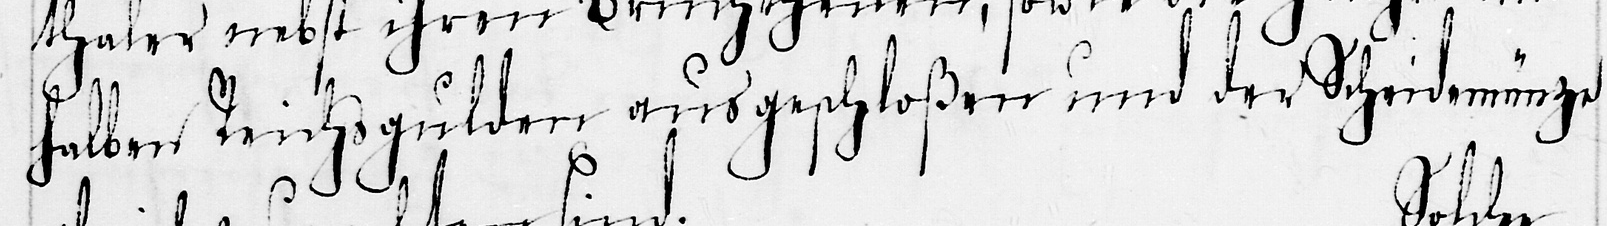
halben Reichsgulden ausgeschloßen und der Scheidemünze
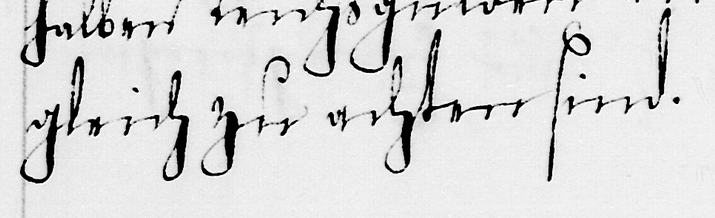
gleich zu achten sind.
